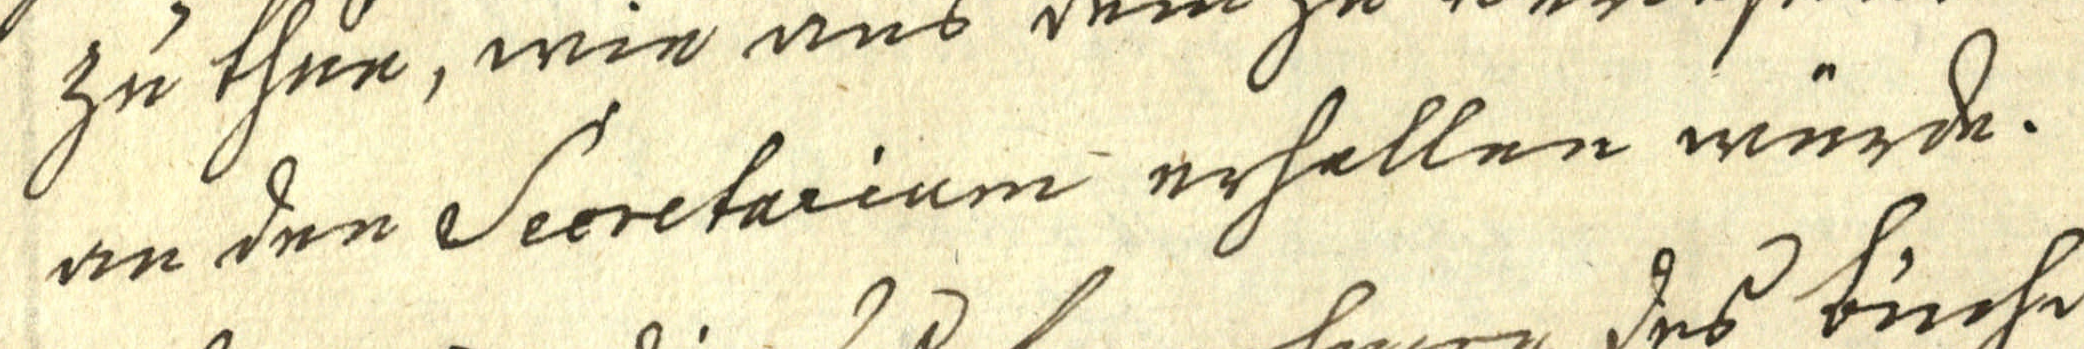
an den Secretarium erhellen würde.
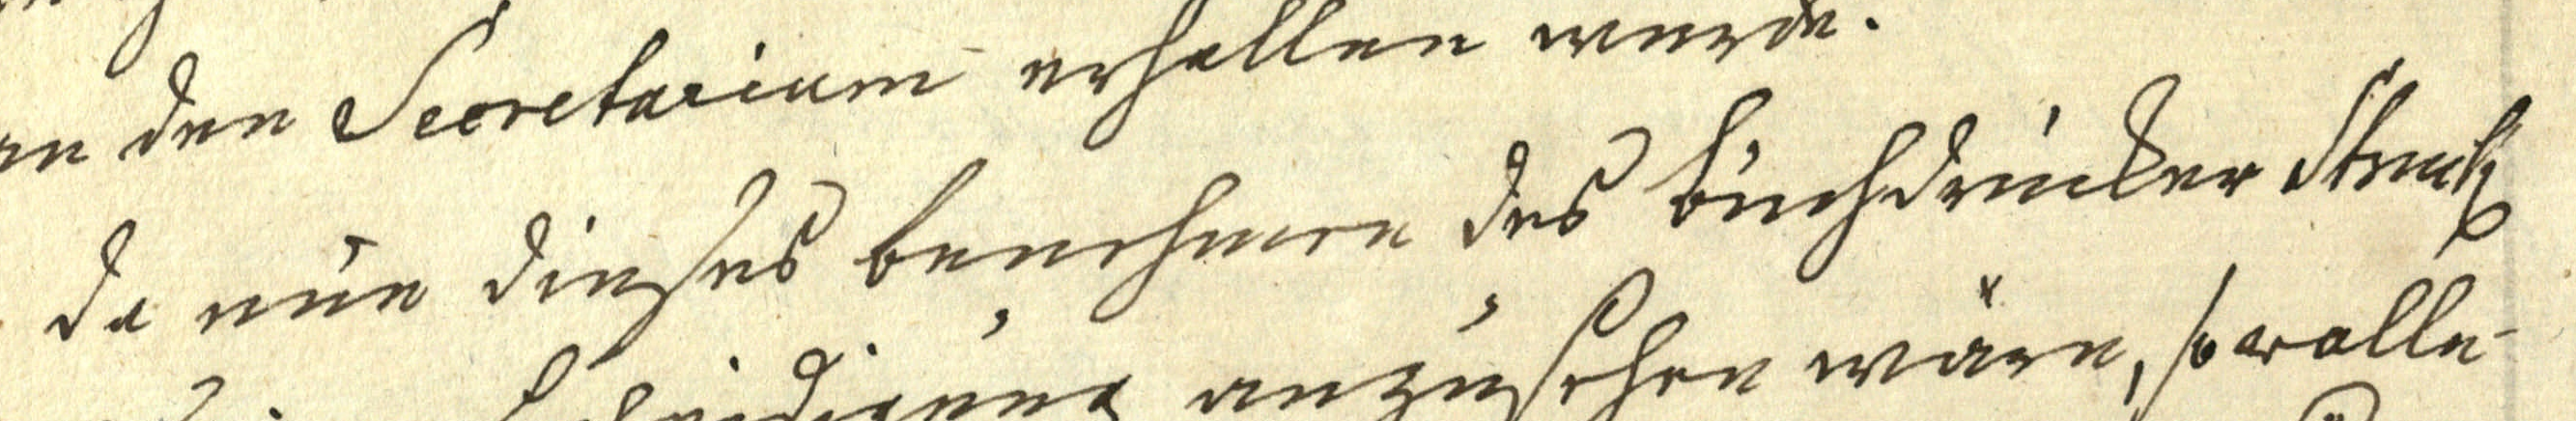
Da nun dieses Benehmen des Buchdrucker Struck
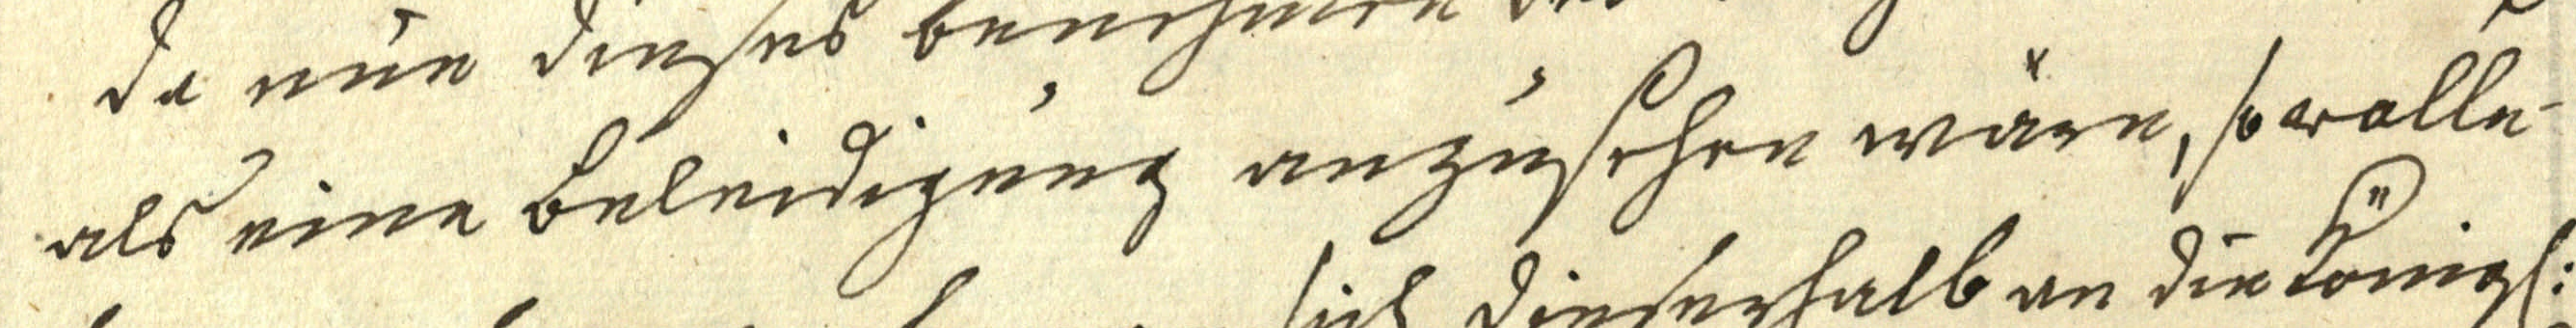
als eine Beleidigung anzusehen wäre, so wolle
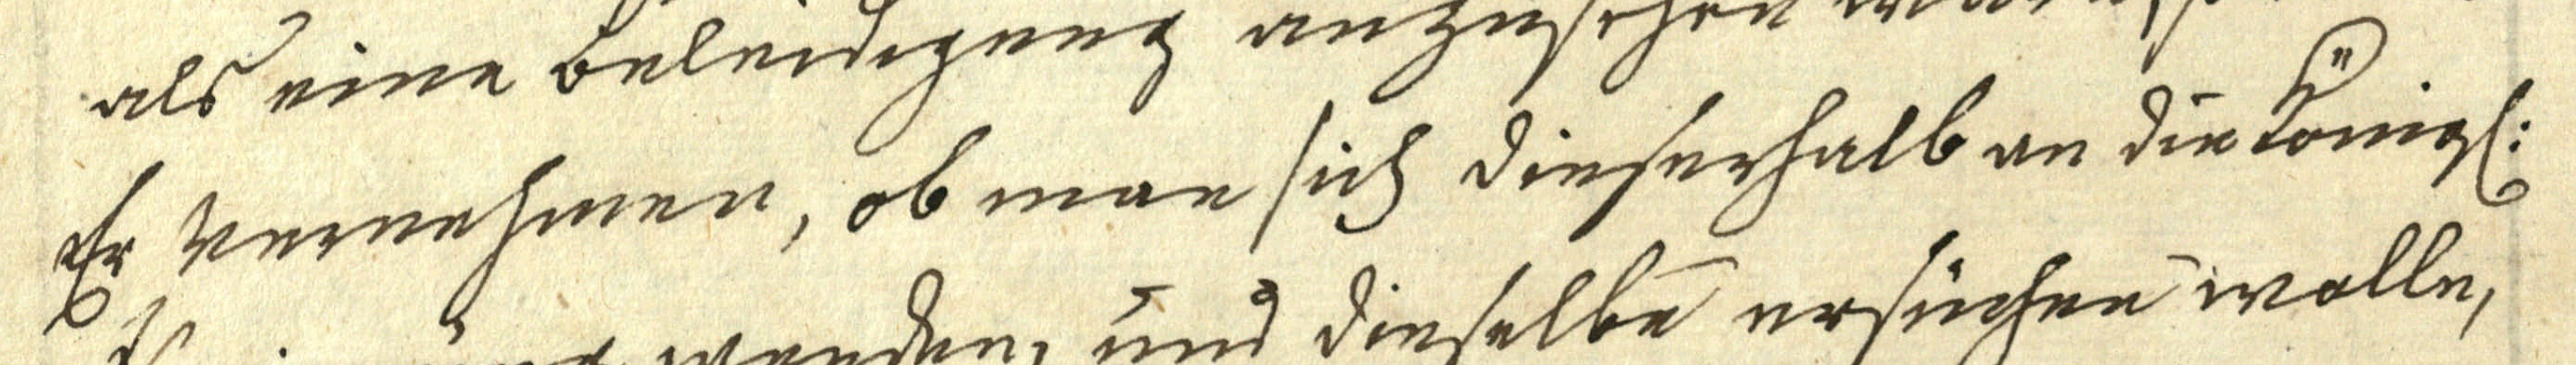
Er vernehmen, ob man sich dieserhalb an die Königl.
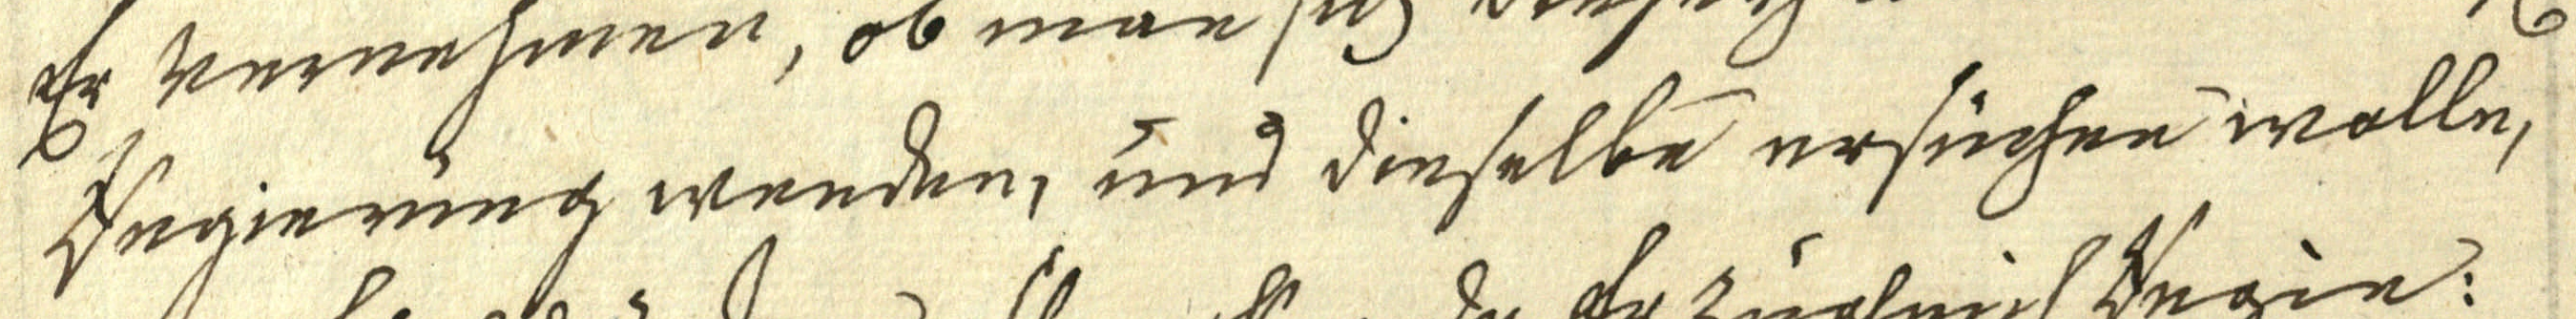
Regierung wenden, und dieselbe ersuchen wolle,
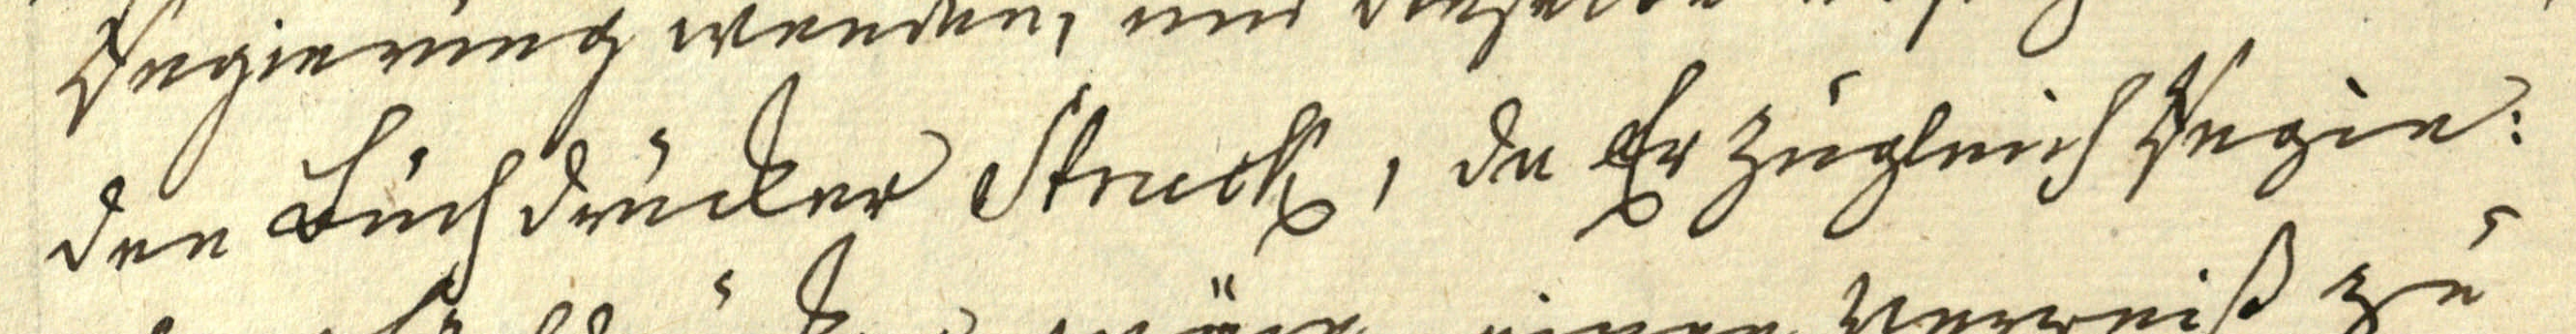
den Buchdrucker Struck, da Er zugleich Regie¬
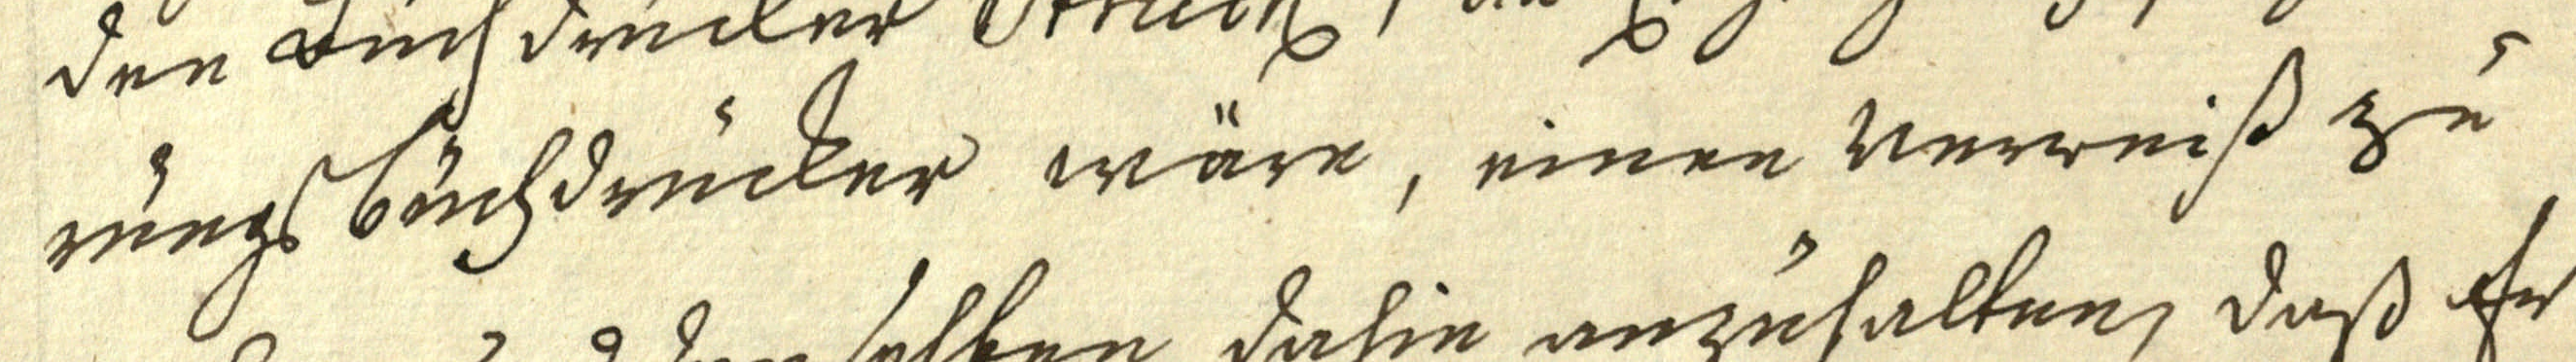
rungsBuchdrucker wäre, einen Verweis zu
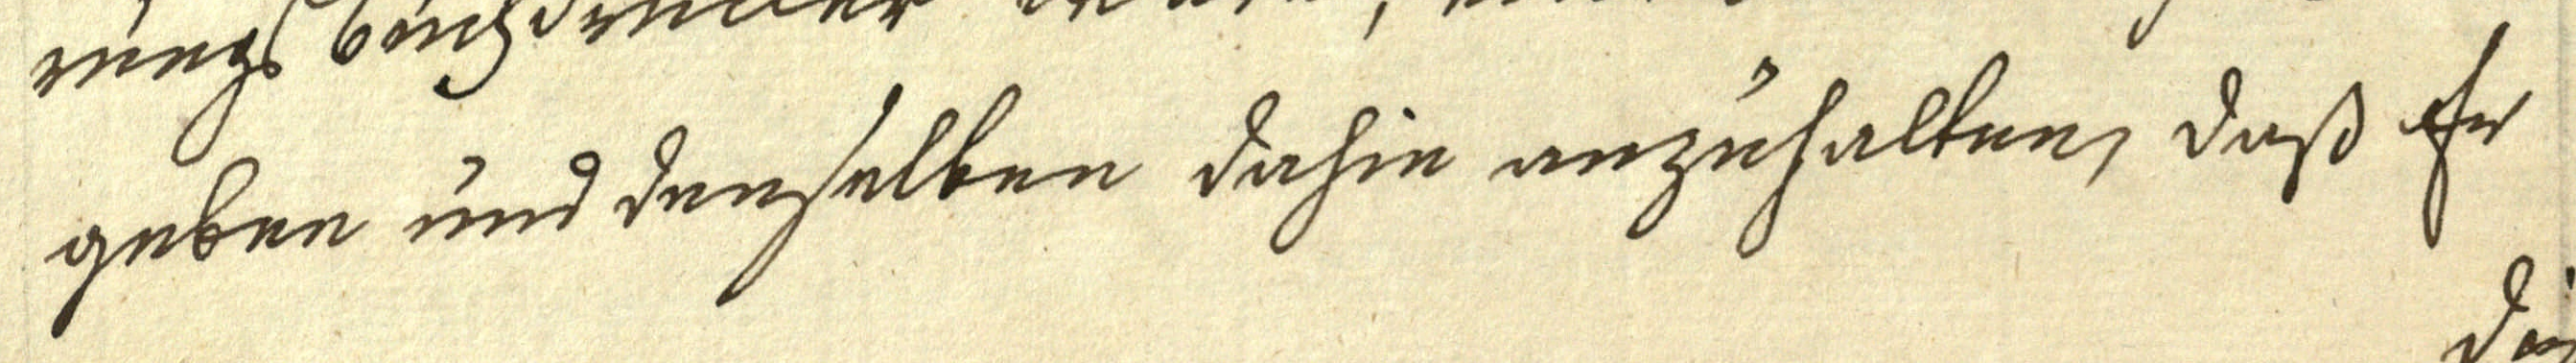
geben und denselben dahin anzuhalten, daß Er
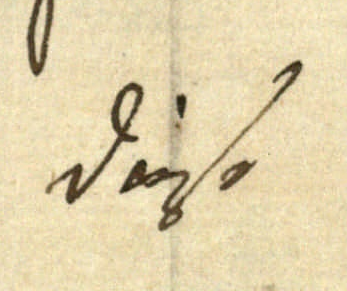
dies
